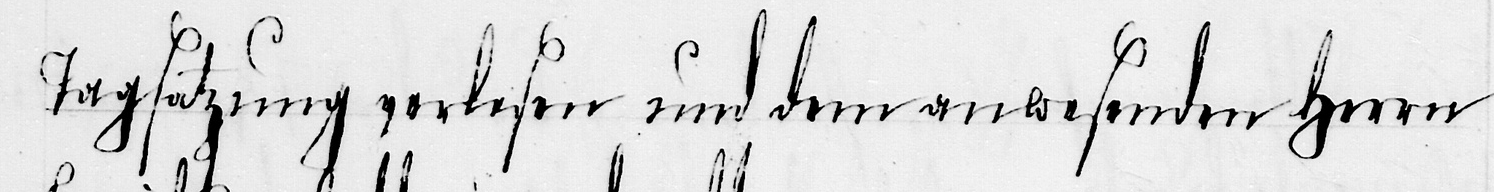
Tagsatzung verlesen und dem anwesenden Herrn
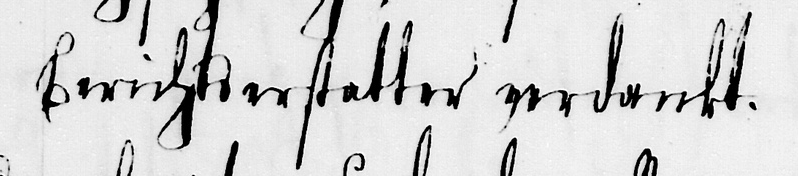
Berichtserstatter verdankt.
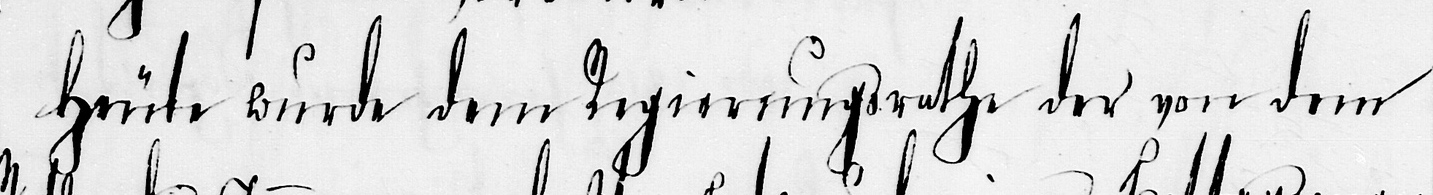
Heute wurde dem Regierungsrathe der von dem
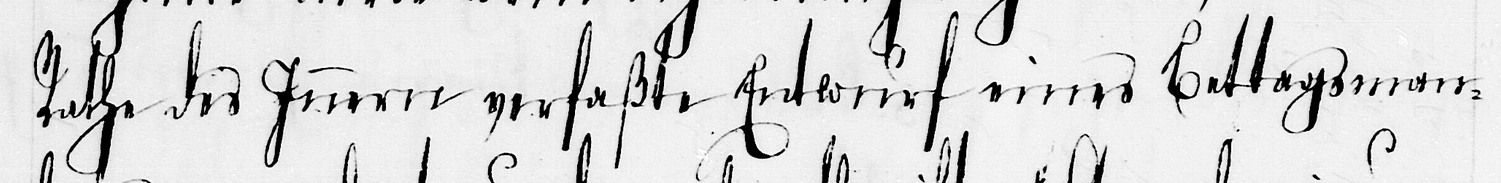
Rathe des Innern verfaßte Entwurf eines Bettagsman¬
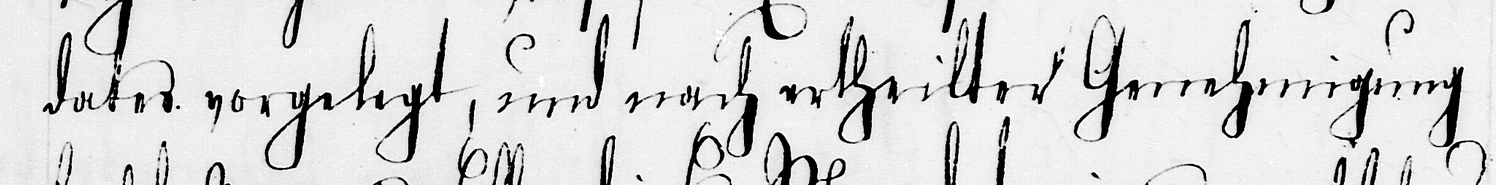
dates vorgelegt, und nach ertheilter Genehmigung
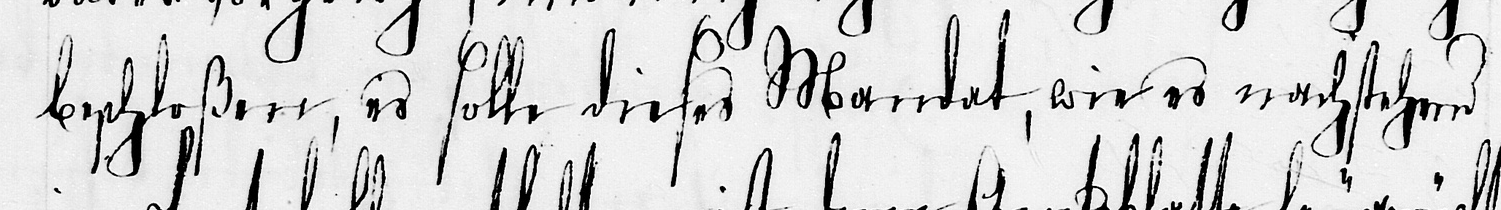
beschloßen, es solle dieses Mandat, wie es nachstehend
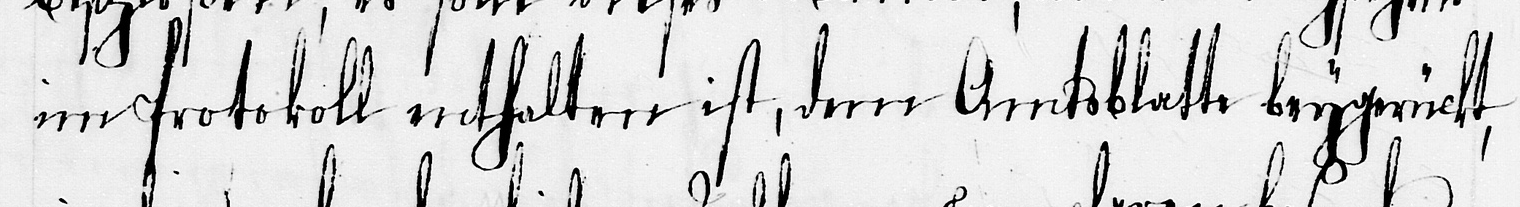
im Protokoll enthalten ist, dem Amtsblatte beygerückt,
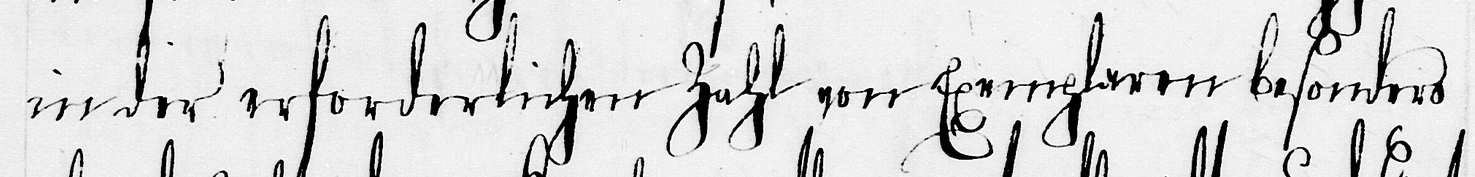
in der erforderlichen Zahl von Exemplaren besonders
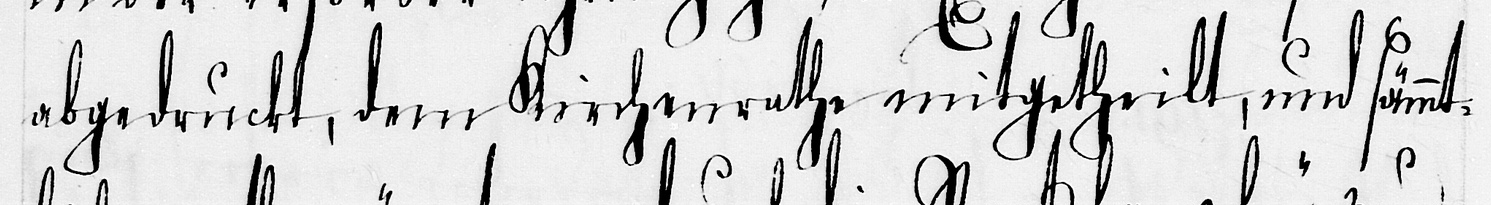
abgedruckt, dem Kirchenrathe mitgetheilt, und säm¬
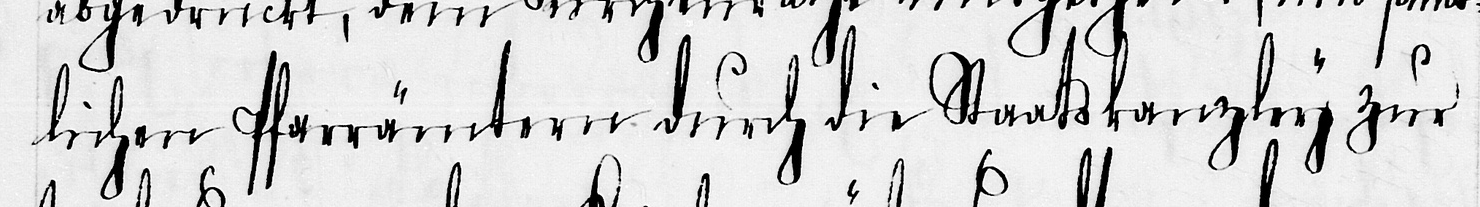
tlichen Pfarrämtern durch die Staatskanzley zur
